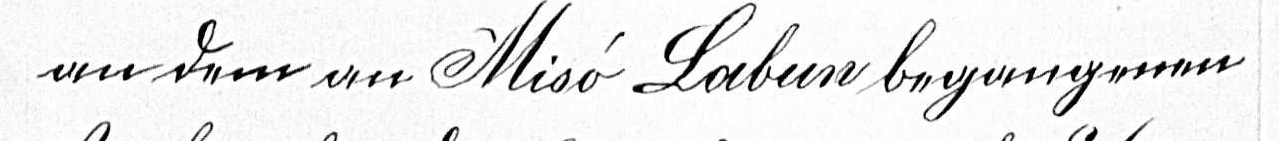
an dem an Misó Labun begangenen
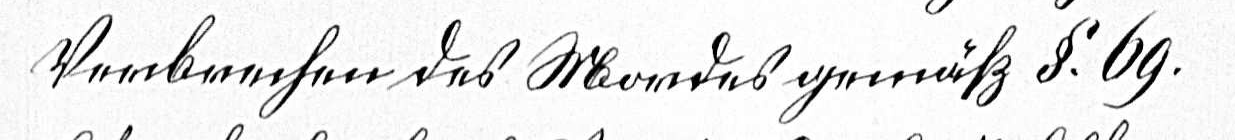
Verbrechen des Mordes gemäß §. 69.
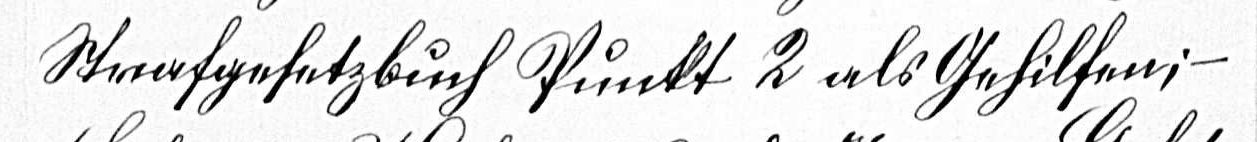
Strafgesetzbuch Punkt 2 als Gehilfen;-
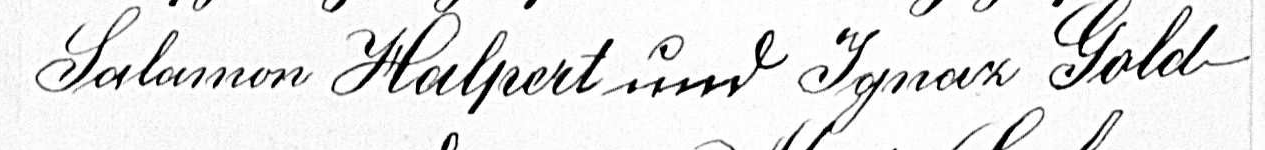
Salamon Halpert und Jgnaz Gold¬
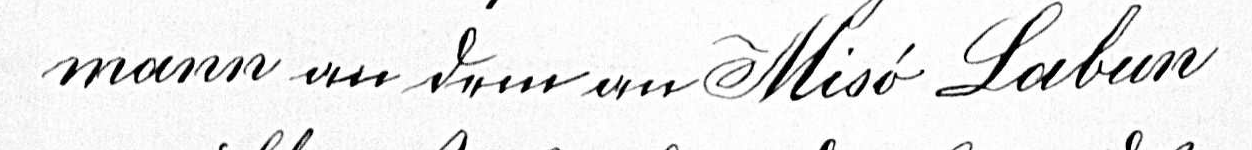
mann an dem an Misó Labun
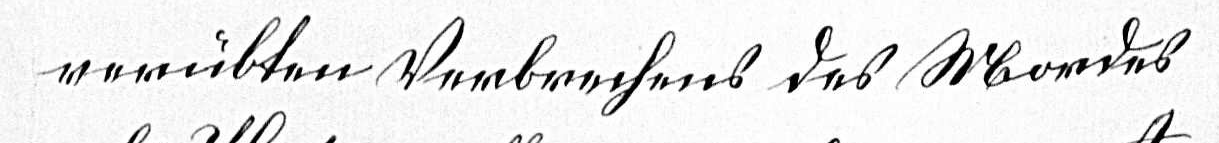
verübten Verbrechens des Mordes
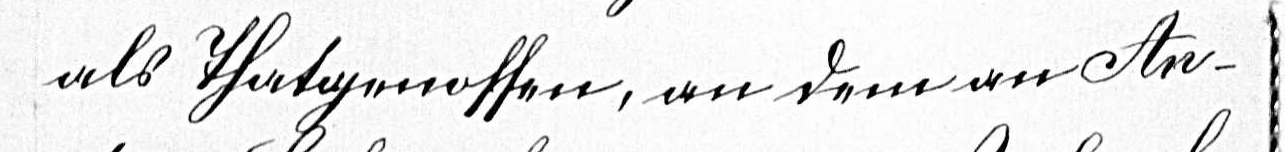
als Thatgenossen, an dem an An¬
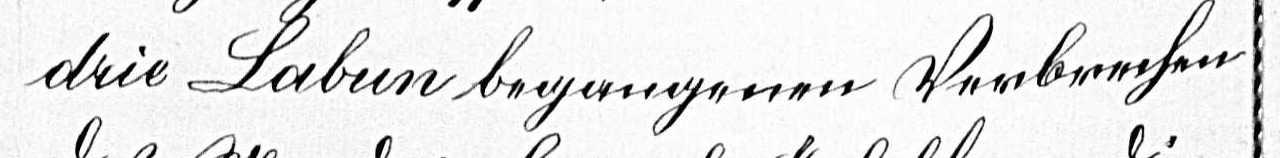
drie Labun begangenen Verbrechen
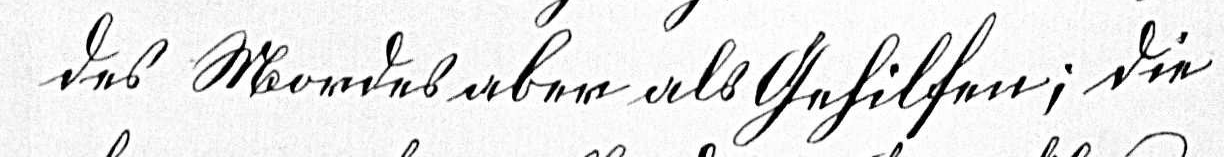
des Mordes aber als Gehilfen; die
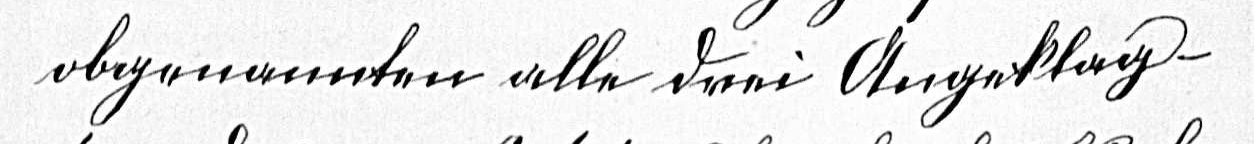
obgenannten alle drei Angeklag¬
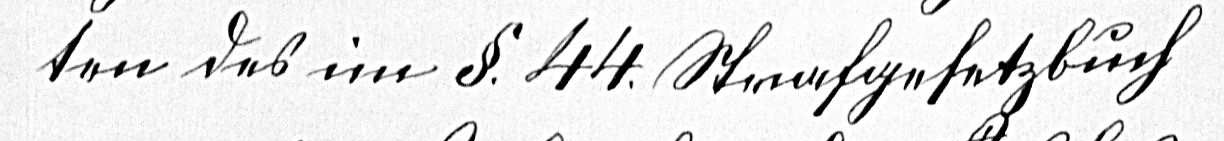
ten des im §. 44. Strafgesetzbuch
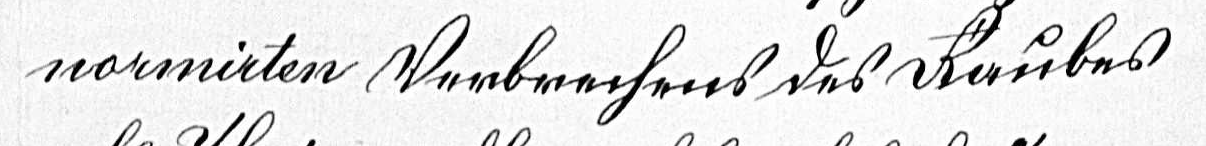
normirten Verbrechens des Raubes
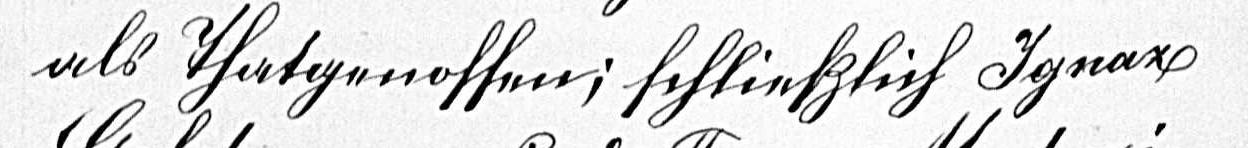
als Thatgenossen; schließlich Jgnaz
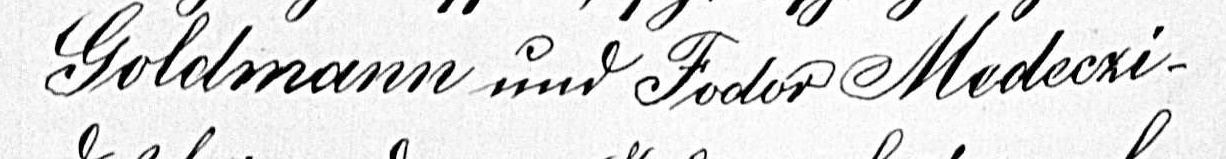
Goldmann und Fodor Medeczi-
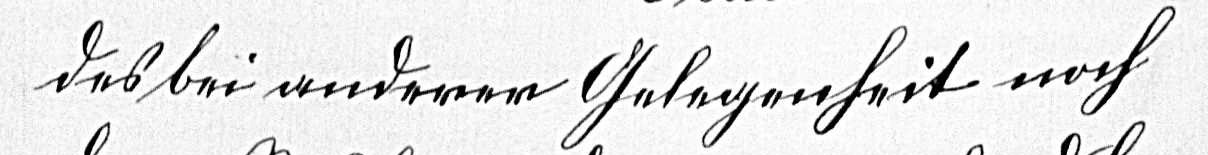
des bei anderer Gelegenheit noch
